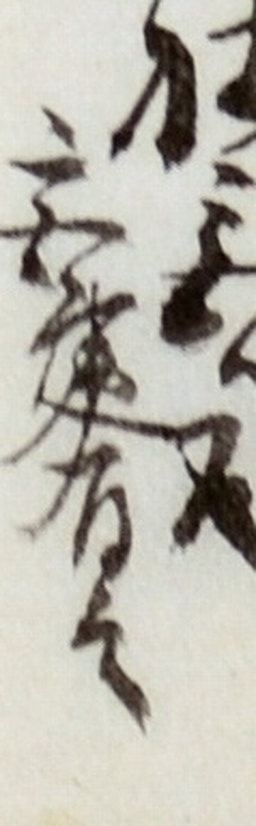宮建有之
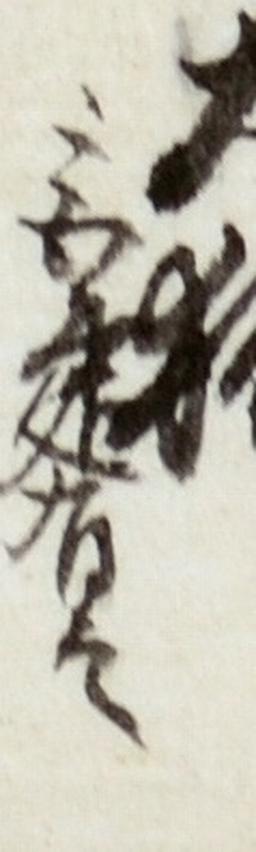宮建有之
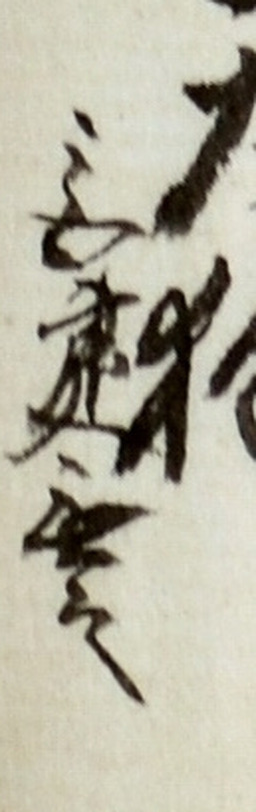宮建無之
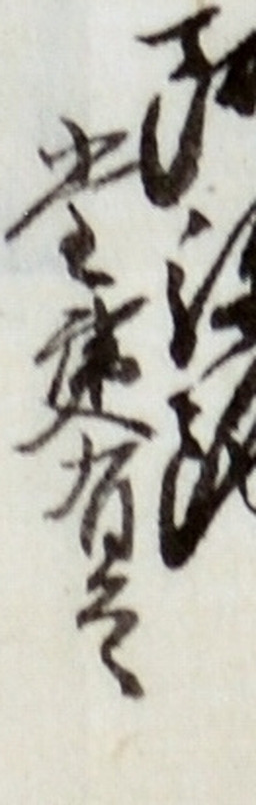堂建有之
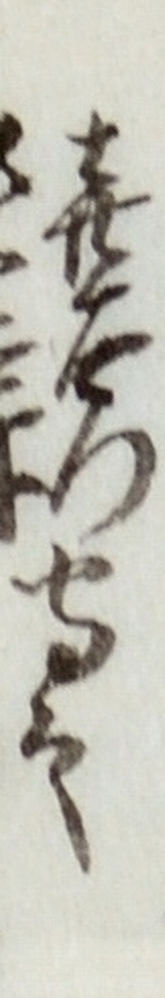徳右衛門守之
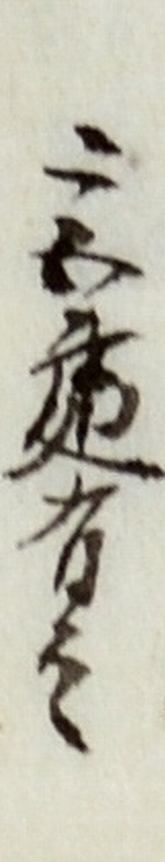宮建有之
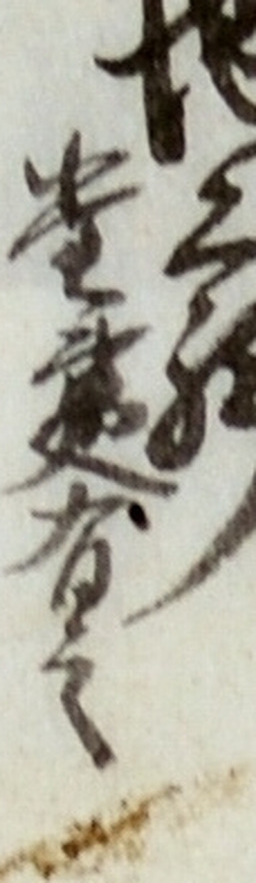堂建有之
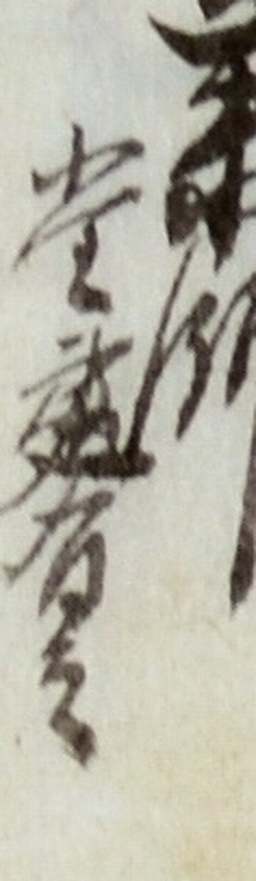宮建有之
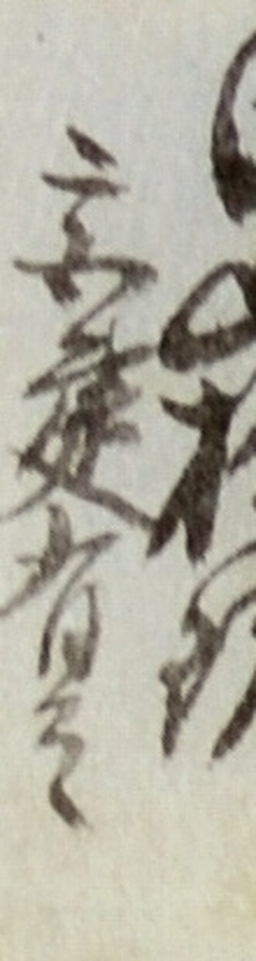宮建有之

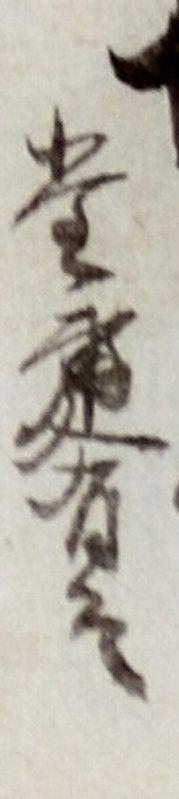堂建有之
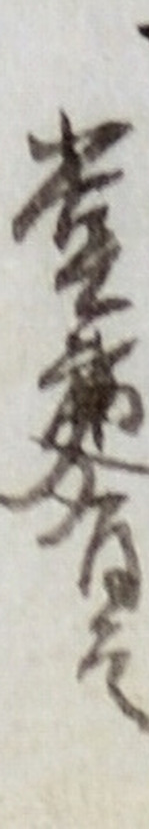堂建有之
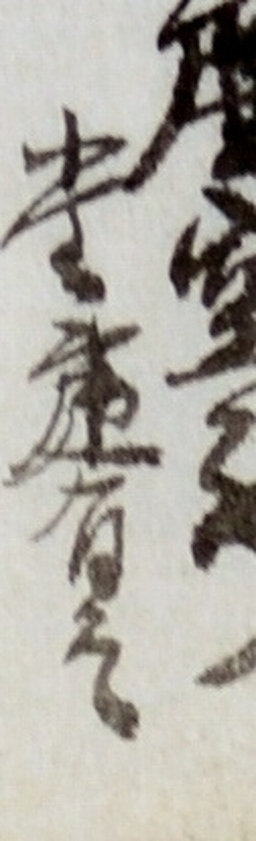堂建有之
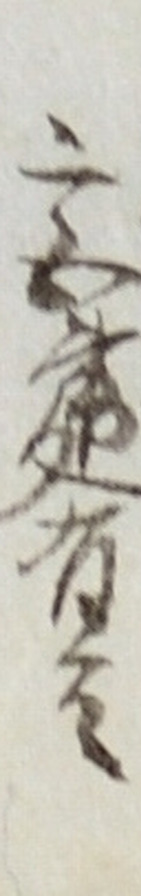宮建有之
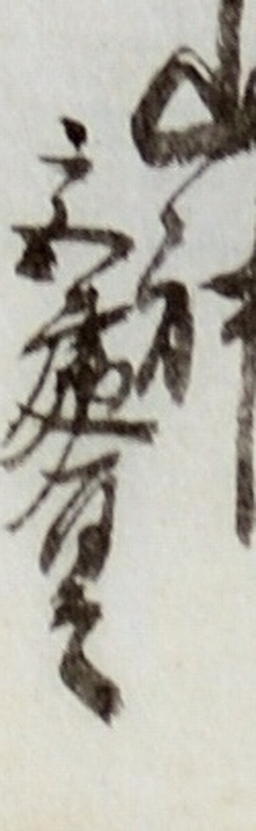宮建有之
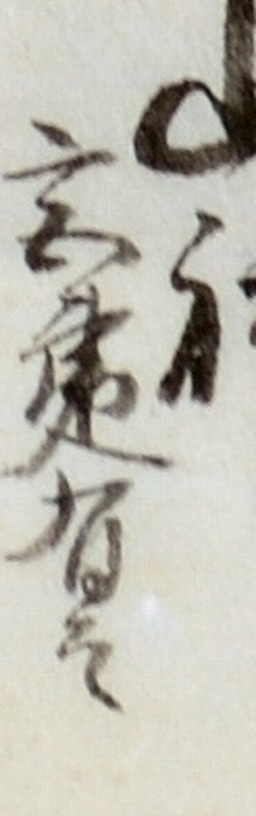宮建有之
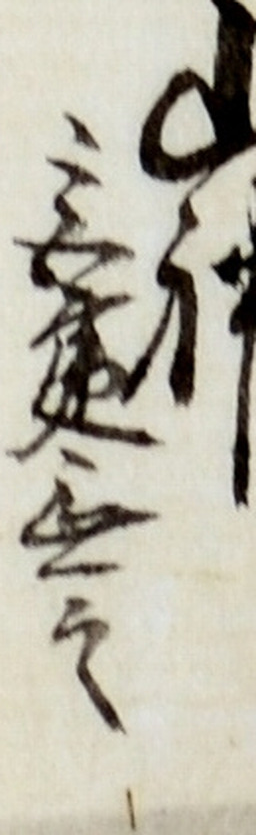宮建無之
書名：御領分中山林社地手控
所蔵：伊那市立高遠町図書館・合同会社AMANE
